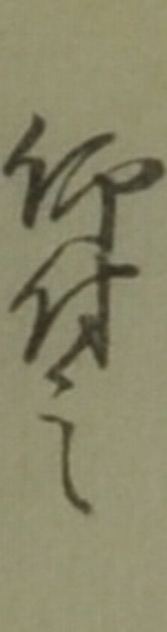仰付之
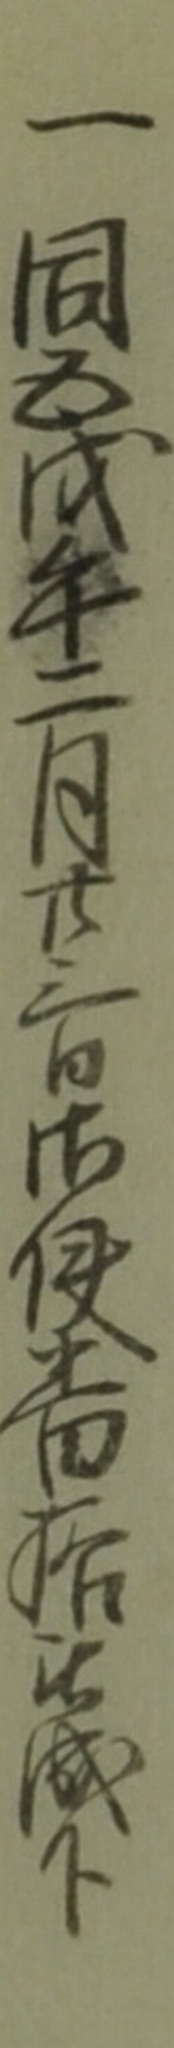一同五戊午二月廿三日御使番格被成下
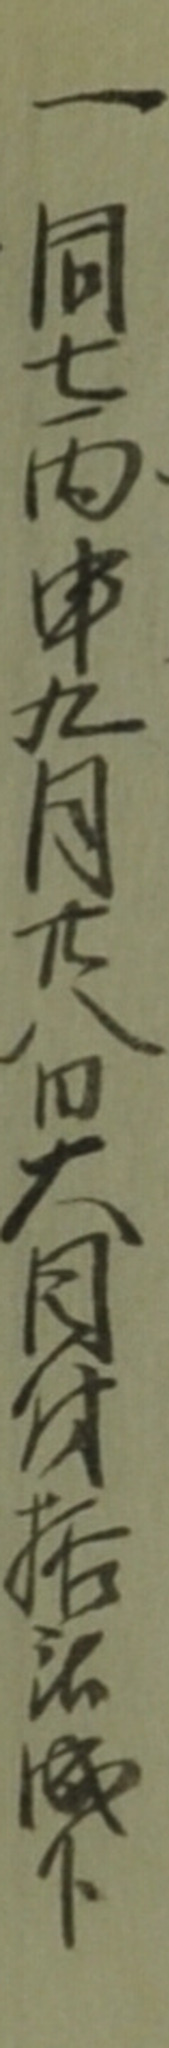其外丙申九月廿八日大目付格被成下
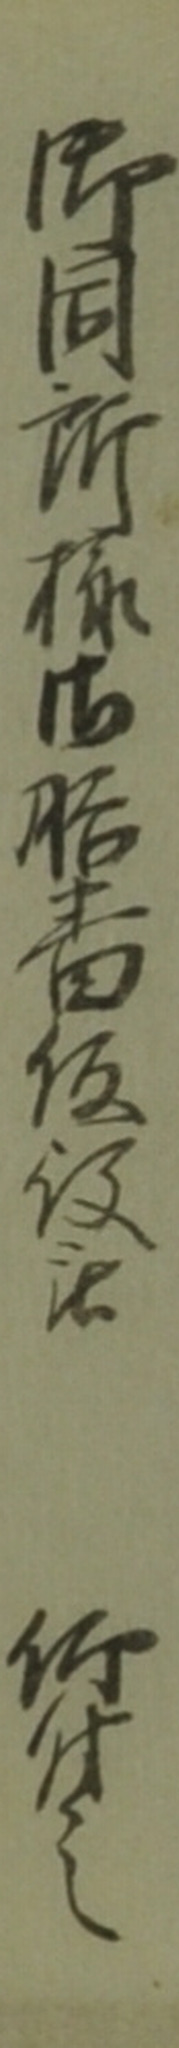御同所様御膳番仮役被仰付之
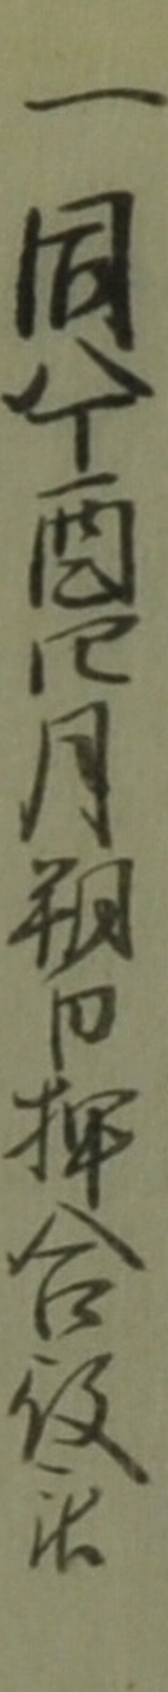一同八丁酉四月朔日押合役被
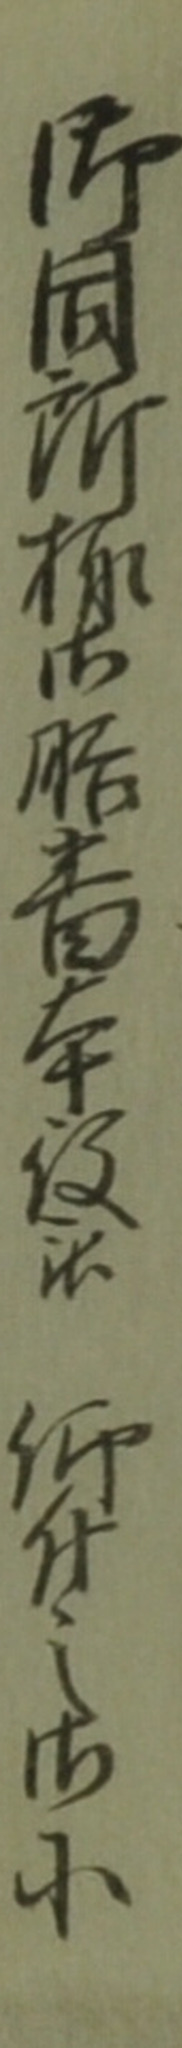御同所様御膳番本役被仰付之御小
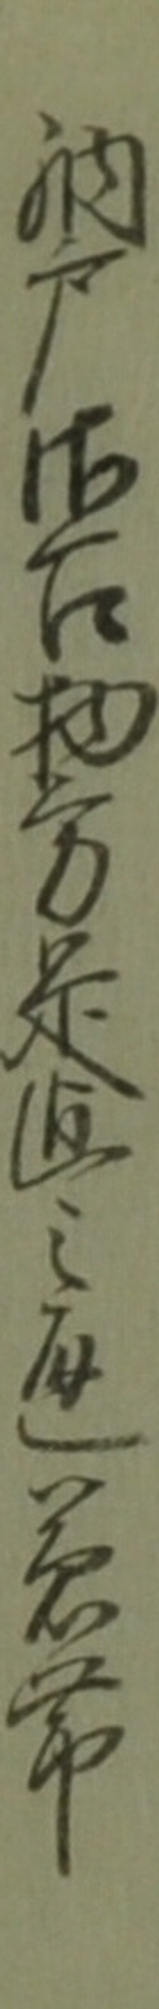納戸御召物方是迄之通兼帯
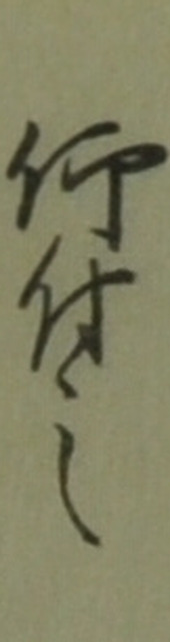仰付之
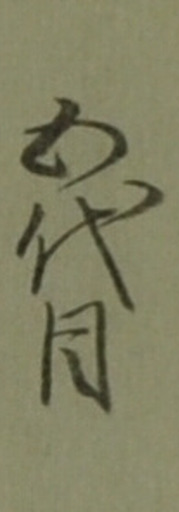五代目
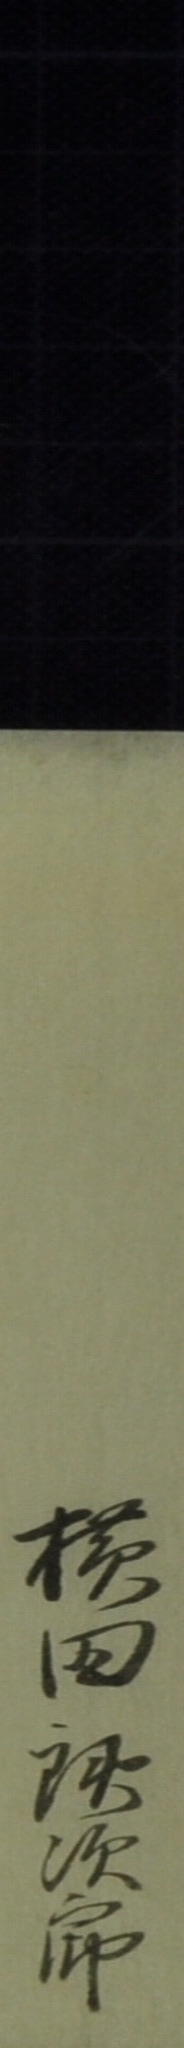横田鉄次郎
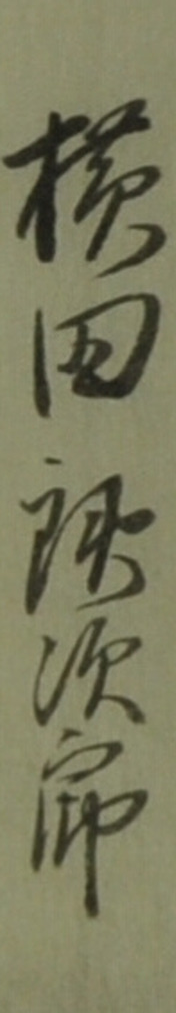横田鉄次郎

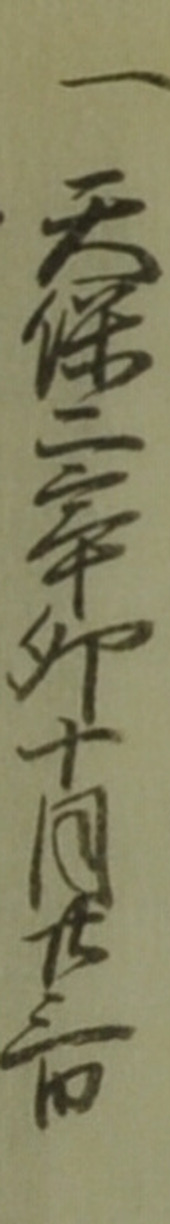一天保二辛卯十月廿三日
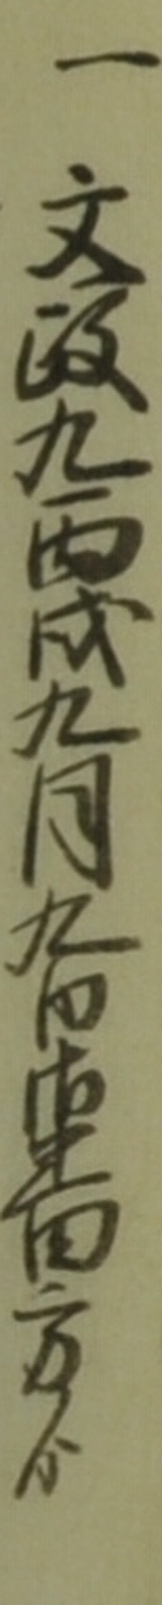一文政九丙戌九月九日御番方ゟ
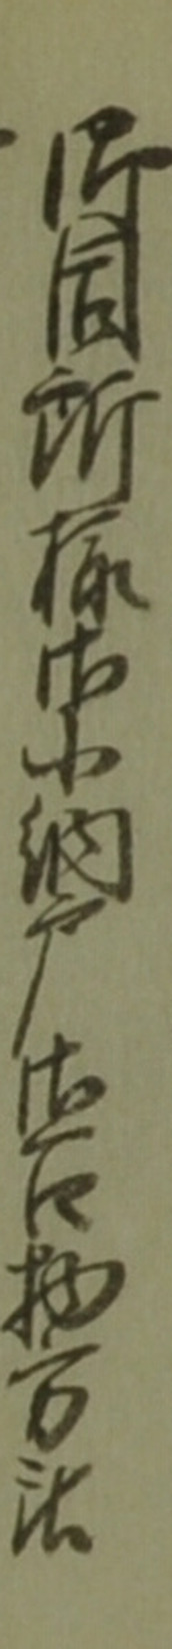御同所様御小納戸御召物方被
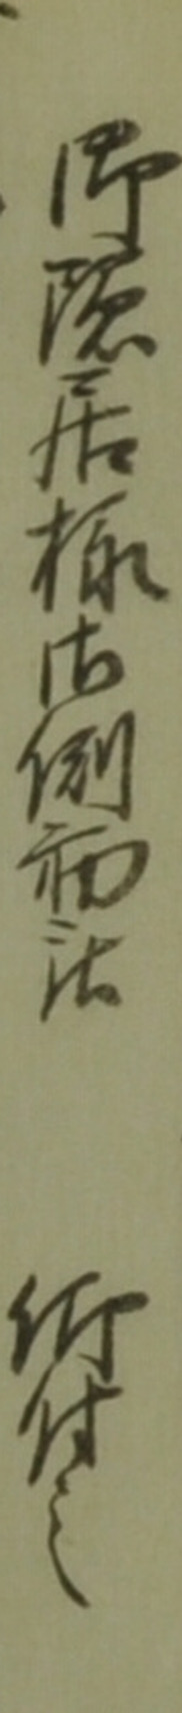御隠居様御側勤被仰付之
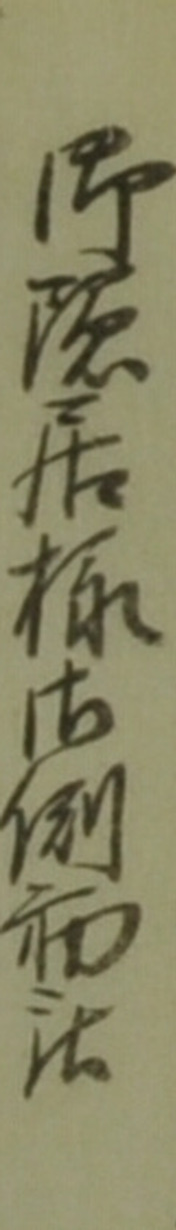御隠居様御側勤
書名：諸御役代々録（五）
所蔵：伊那市立高遠町図書館・合同会社AMANE
